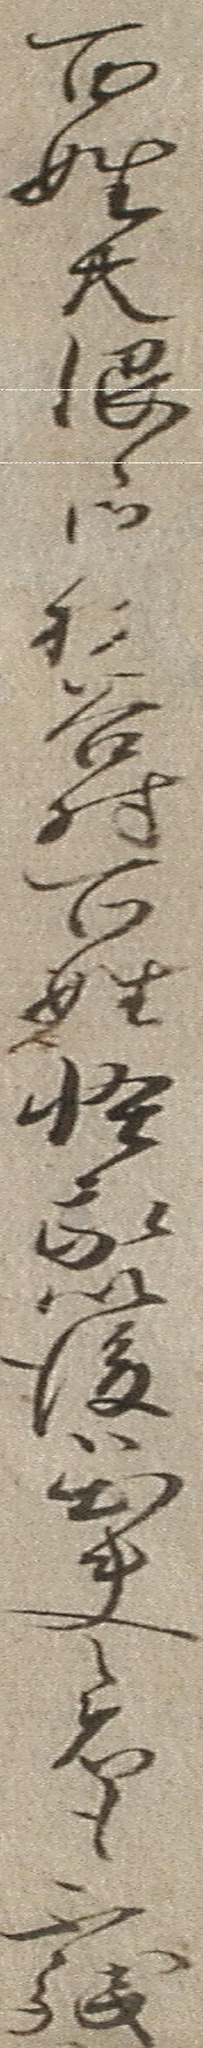百姓共恨み候杉谷村百姓怪我以後は出夫之者も不残
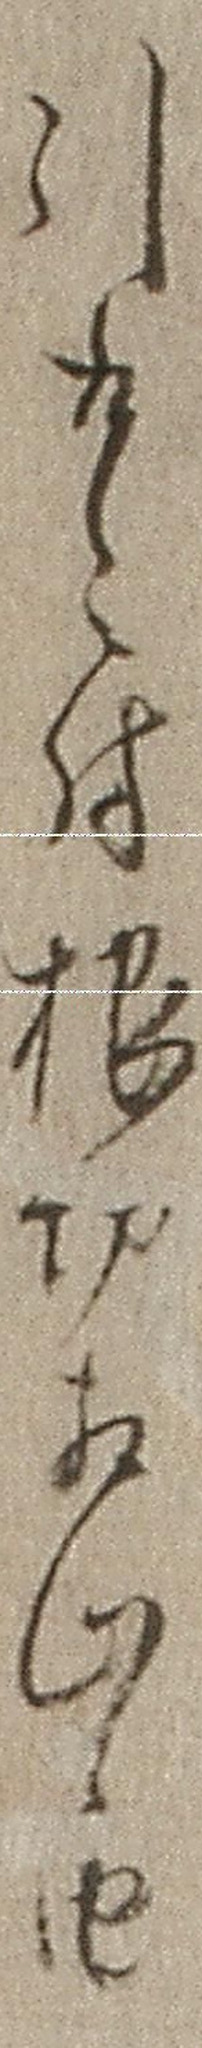引取候に付根切相止候由
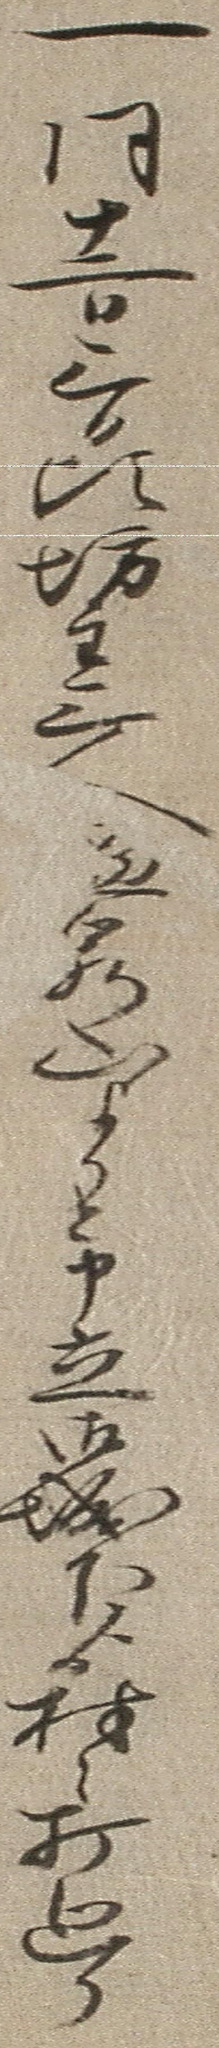一同十二日三日頃坊主三人温泉山よりと申立御城下ゟ村々打廻り
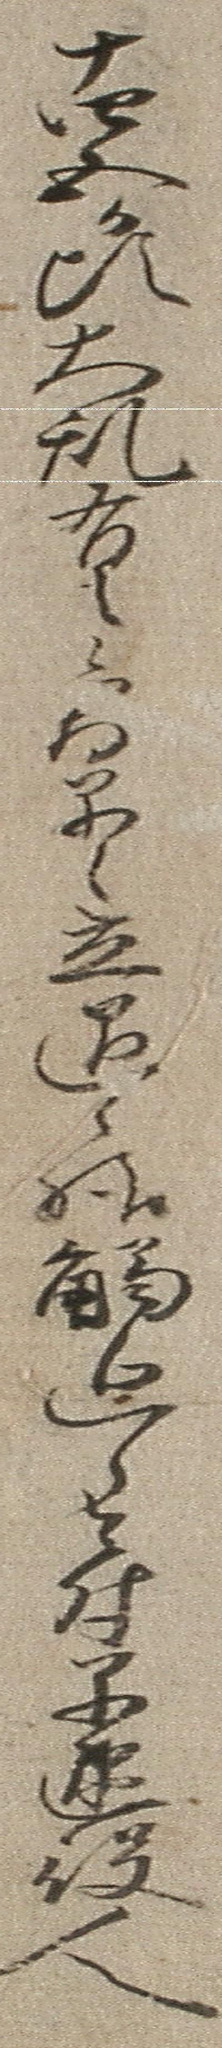十四五日頃大乱有之候間早々立退候様觸廻り候に付早速役人
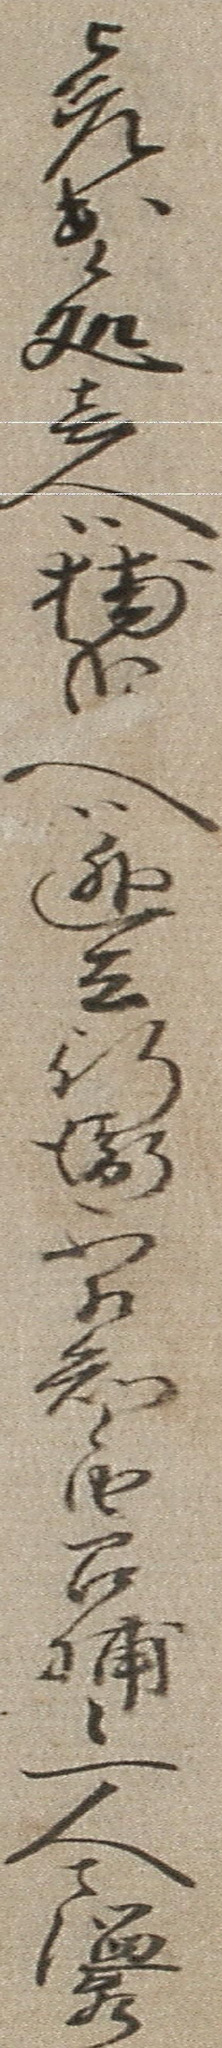被差出候処壱人は捕弐人は逃去行衛不相知候由召捕之一人者温泉
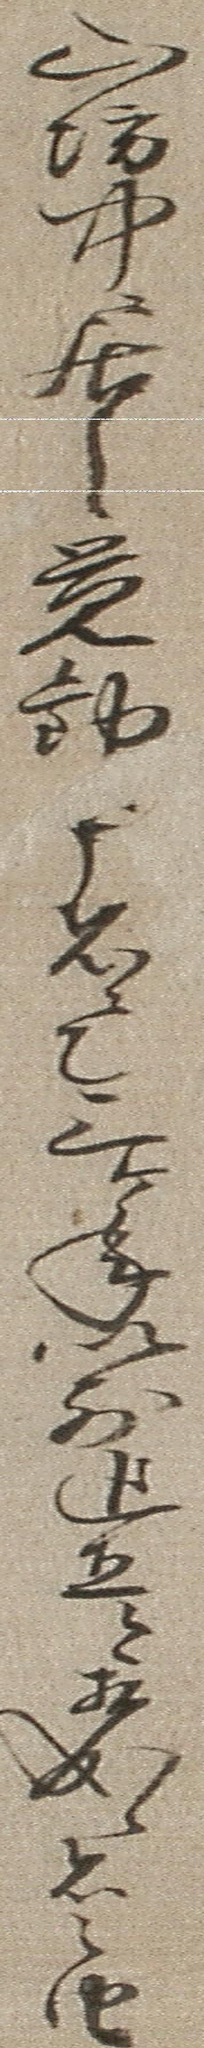山坊中に居候覚勧と申者にて三ヶ年以前追立に相成候者之由
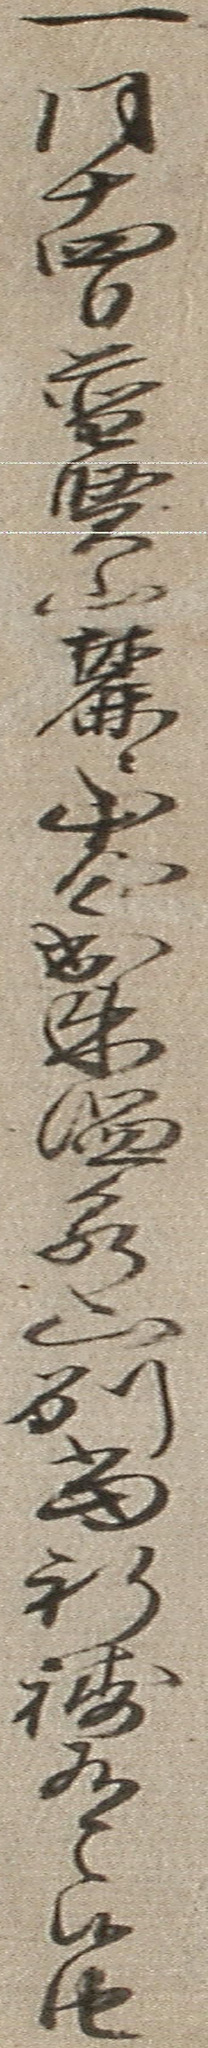一同十四日普賢山麓に山伏出来温泉山別当祈祷有之候由
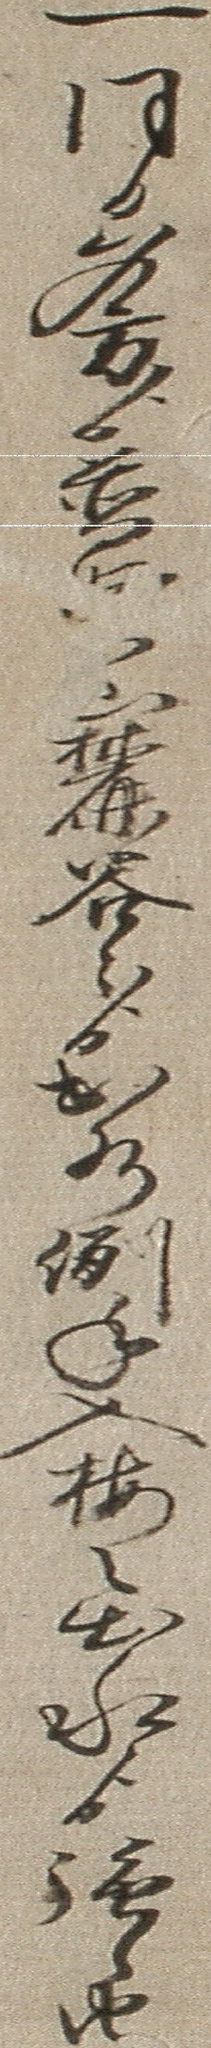一同日夕方ゟ普賢山麓谷々ゟ出水例年入梅之出水ゟ強候由
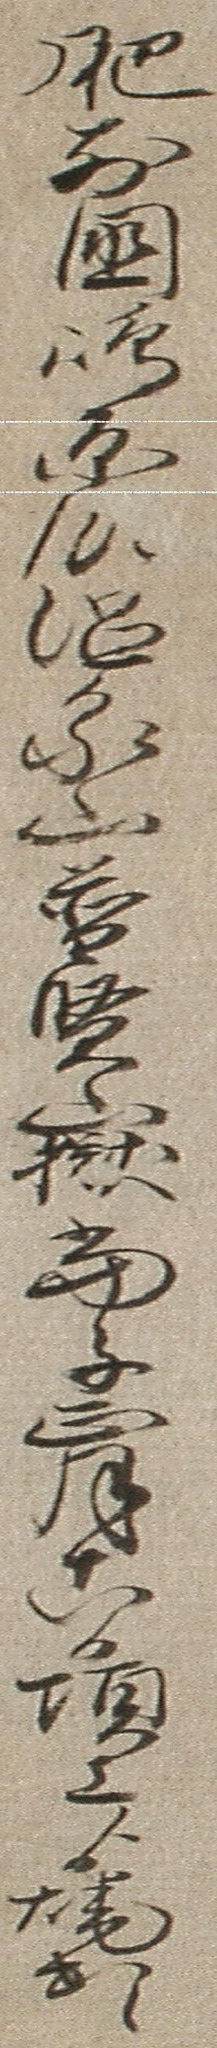肥前国嶋原温泉山普賢嶽当子正月十八日頂上ゟ焼出し
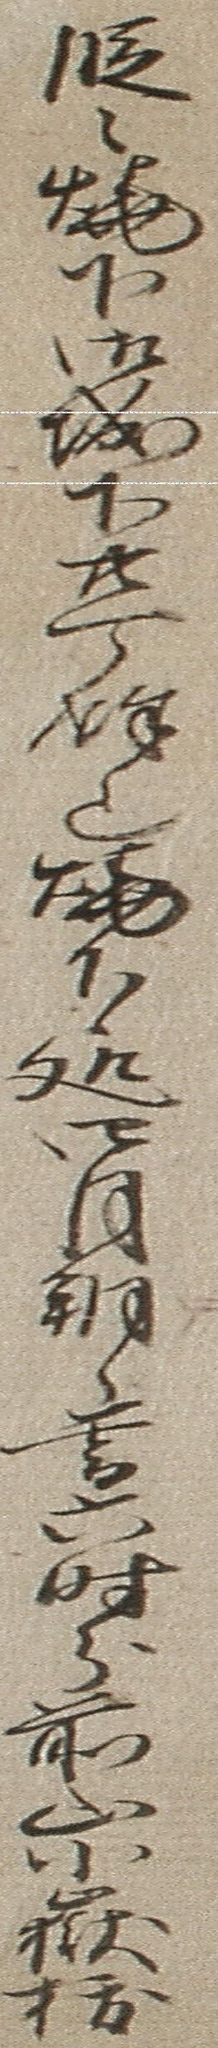段々焼下御城下廿丁餘迄焼下候処四月朔日暮六時分前山嶽抜け
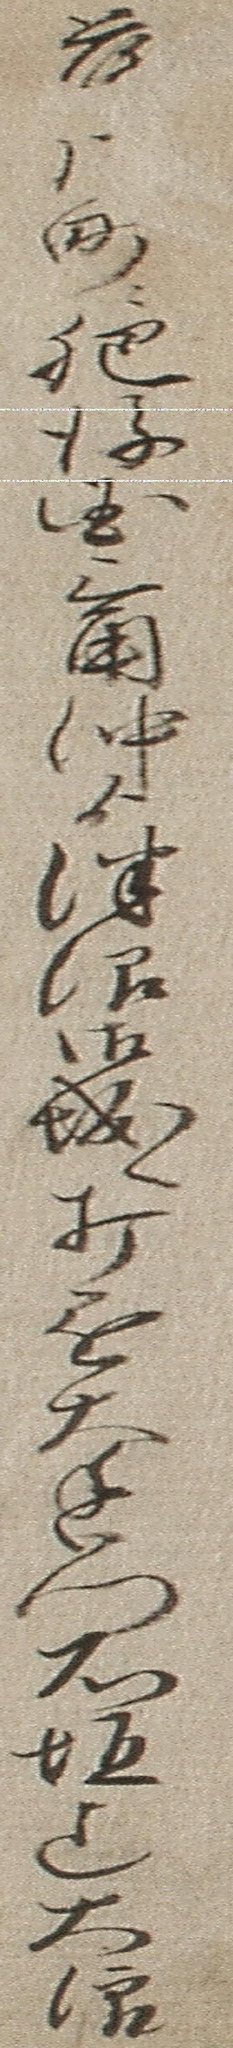落同町に肥後国三角沖ゟ津浪御城へ打懸大手御門石垣迄大浪
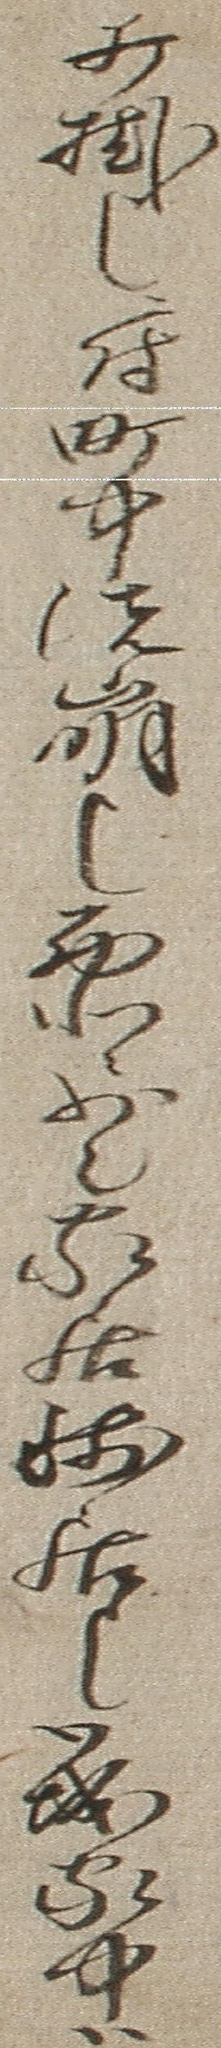打掛申候に付町中洗崩申候西北に少し家居残居申候御城家中は

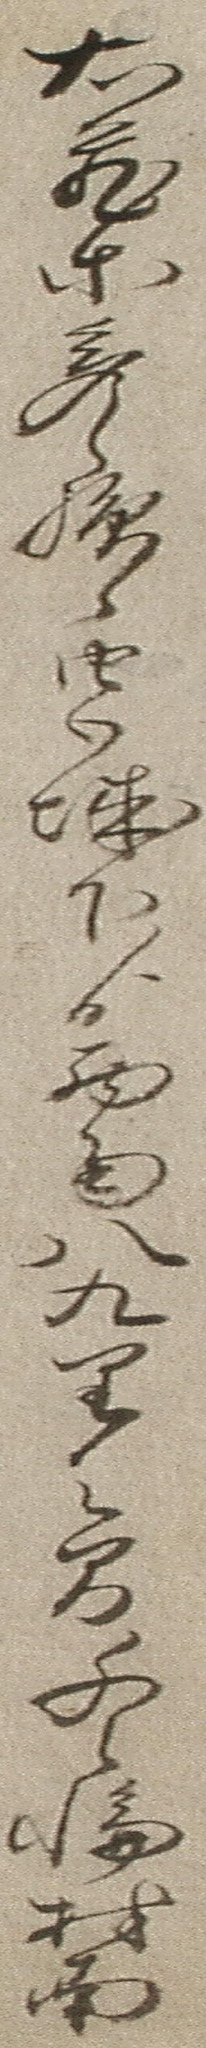右蔵等多く損候由御城下ゟ西南八九里之間千々輪村南
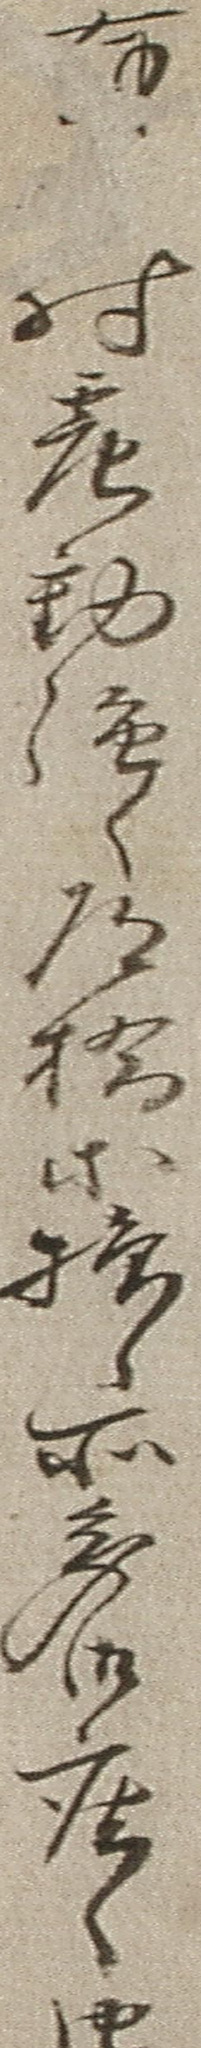村震動強道橋等損候所多御座候由
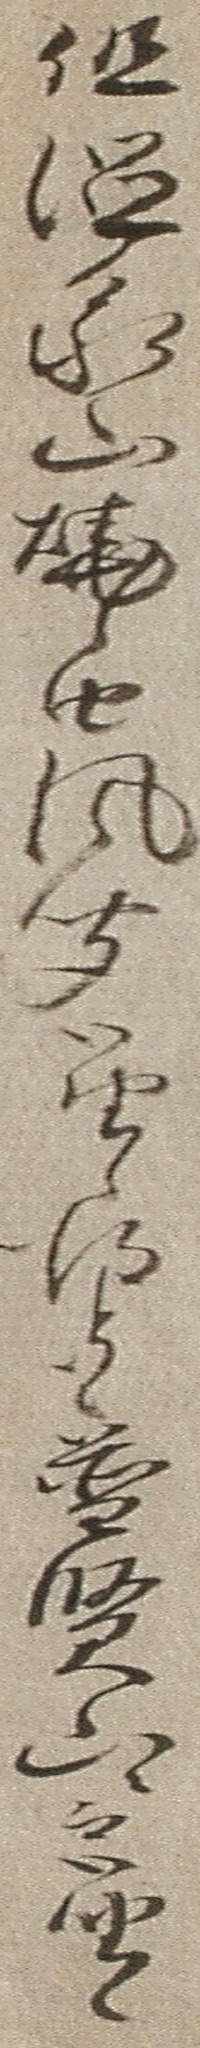但温泉山焼候由風聞御座候得とも普賢山に而御座候
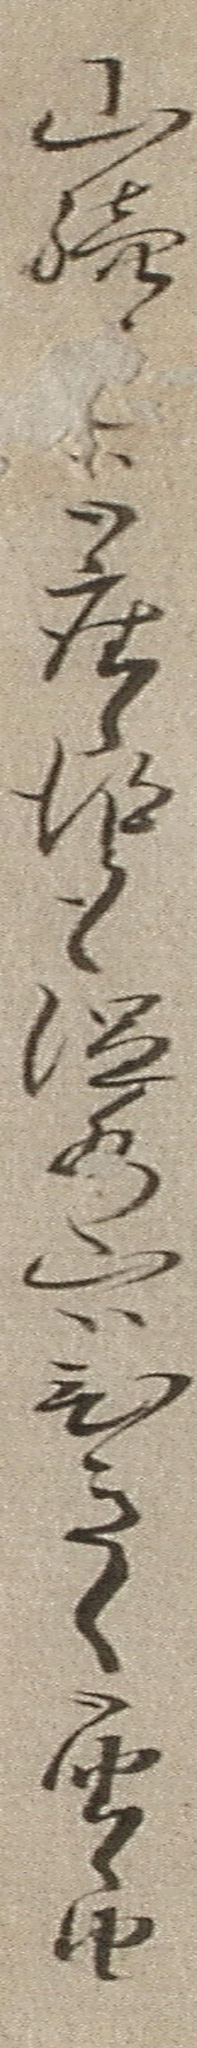山続には御座候得とも温泉山はひきく御座候由
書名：太平秘録抜書　浅間山燒及普賢山崩
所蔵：東京大学地震研究所図書室 Earthquake Research Institute Library, The University of Tokyo, JAPAN
